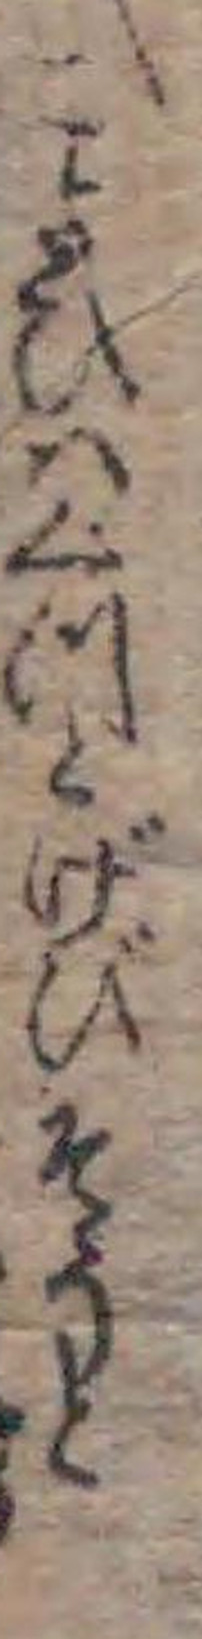〽こよひはくつとげびそうと
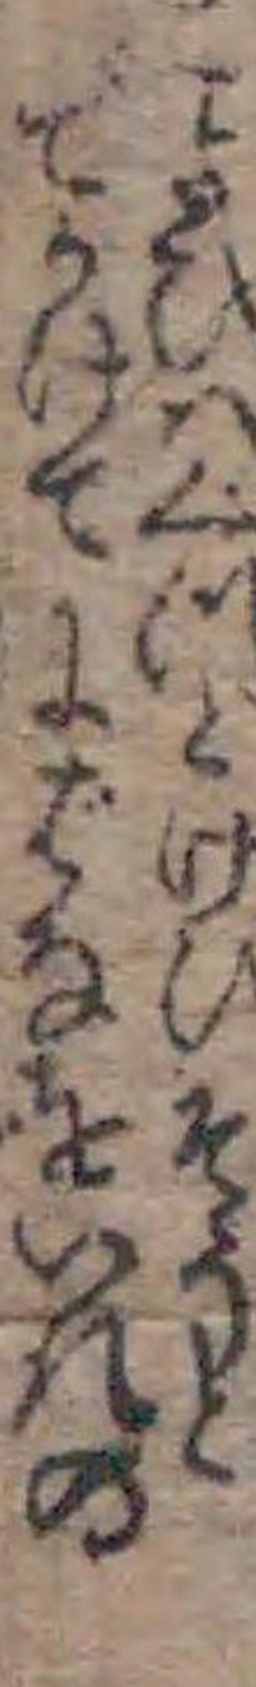でかけてにばなをいれの
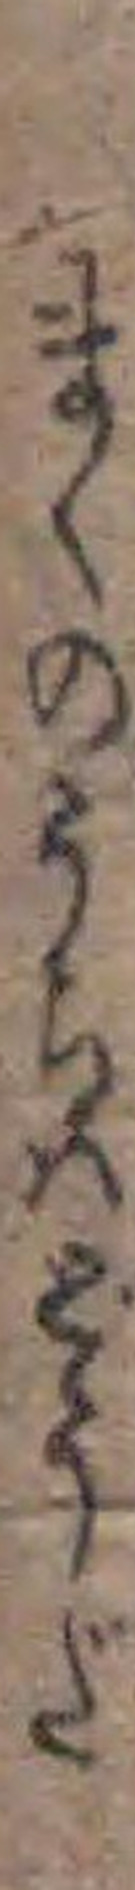まゝのうちはどうだ
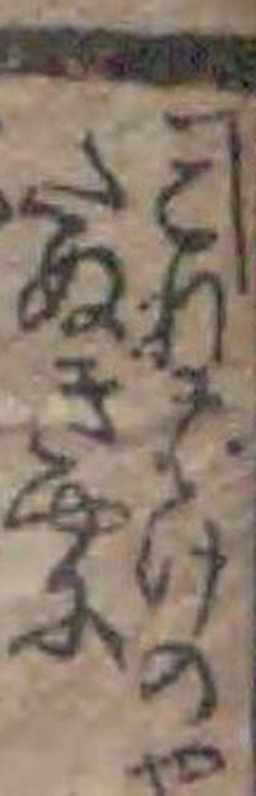たぬきやに
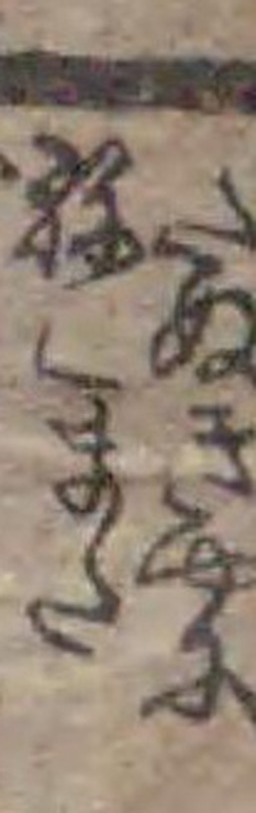ねこまた
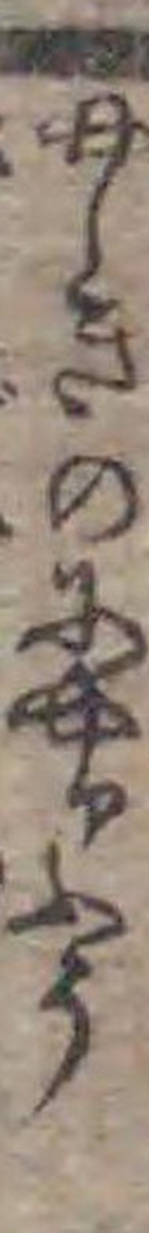やしきのにやァふう
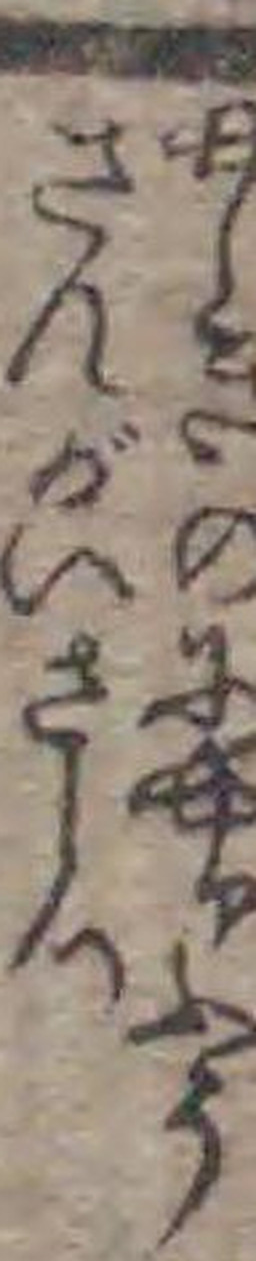さんがいさしつ
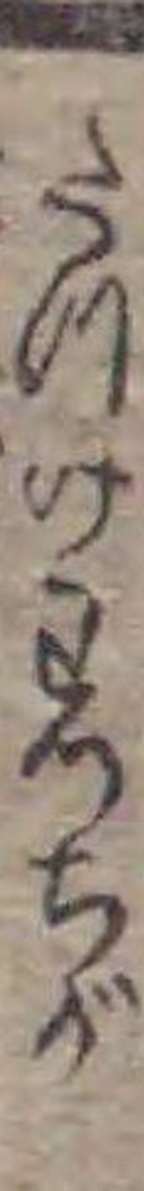たつけわつちが
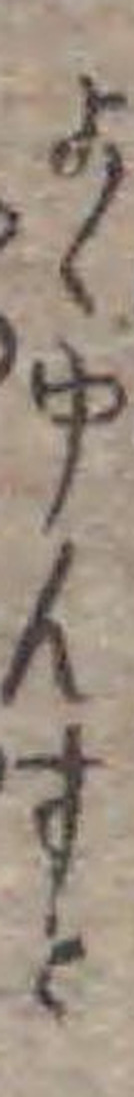よくやんすと
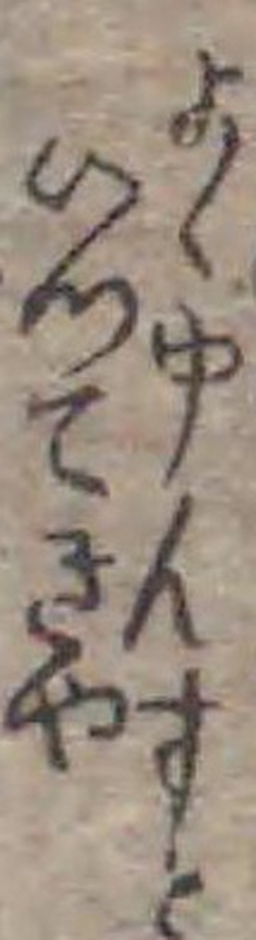いつてきや
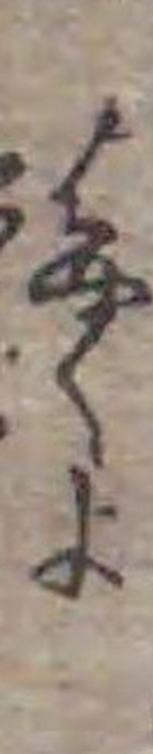はやくよ
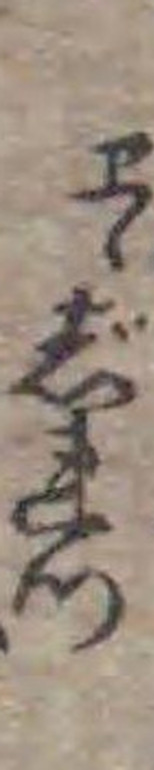ェヽじれつ
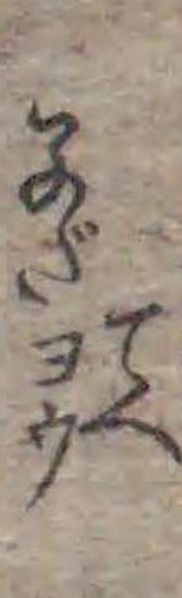子だヨウ
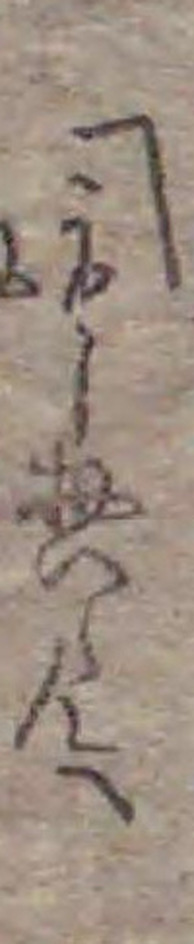〽もしおいらんへ
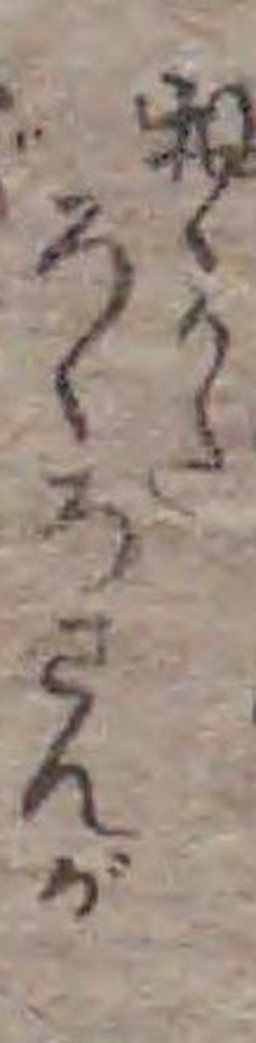ろくろさんが

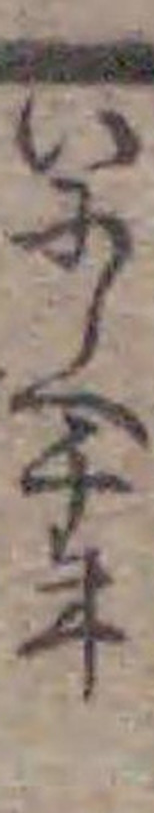いにしへ千年
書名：年中行状記 : 2巻
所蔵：国立国会図書館 National Diet Library, JAPAN
